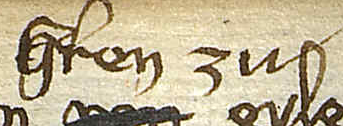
H*ren ʒu
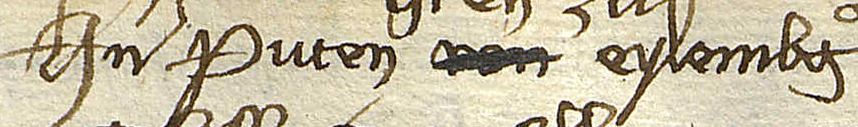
H*N Puten von eylemb*g
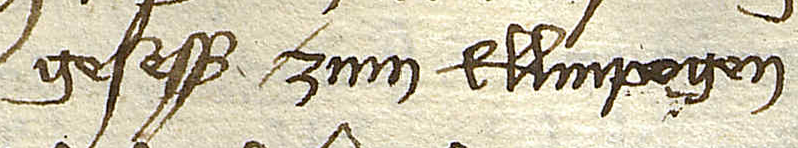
geſeſſ* ʒum Ellmpogen
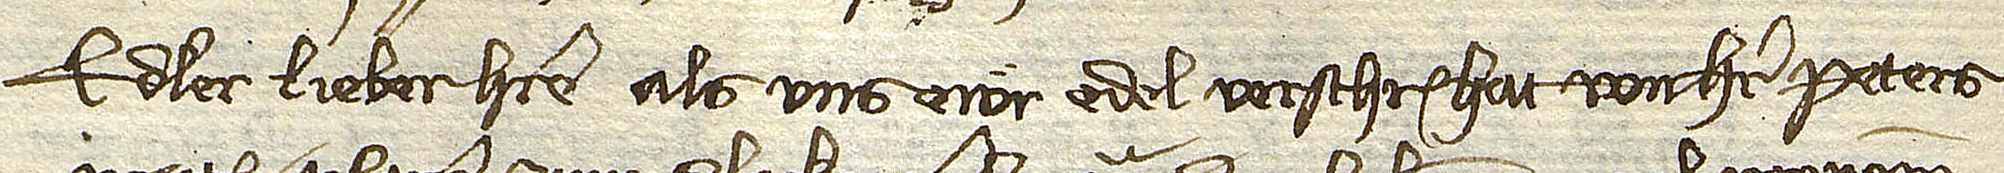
Edler lieber h*re als vns ewr edel verſchr* hat von h*r Peters
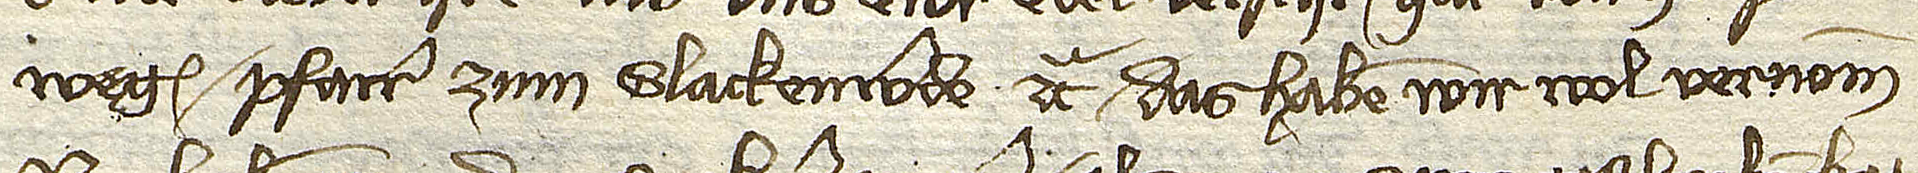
weg* / pfarr* ʒum Slackenw*de . ec* / das habe* wir wol vernom*
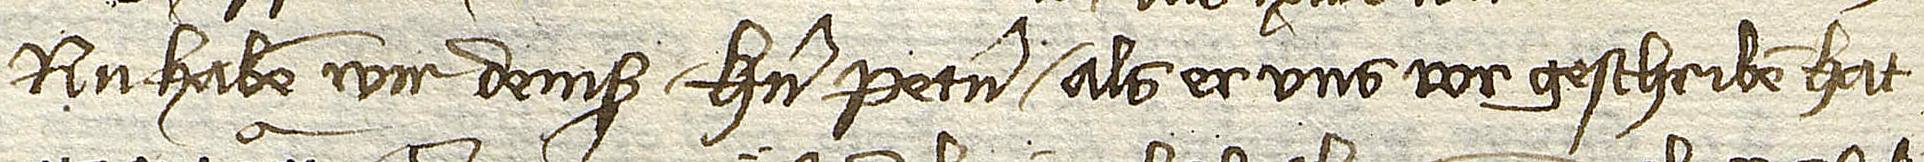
Nu habe* wir demſ* / h*n Pet*n / als er vns vor geſchribe* hat
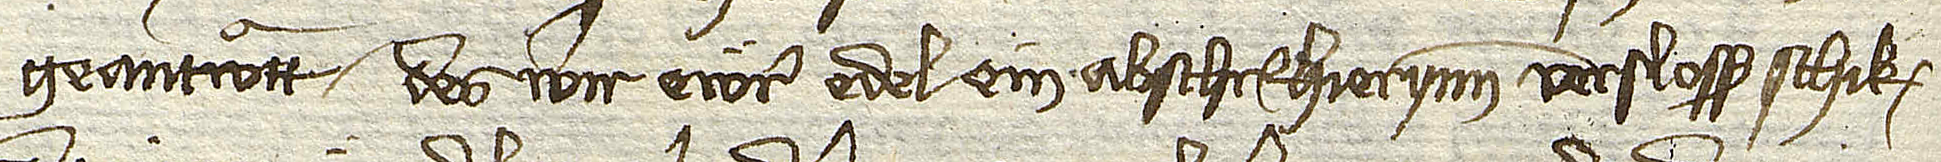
geantw*tt / Des wir ew*r edel ein abſchr* hierynn* verſloſſ* ſchik*
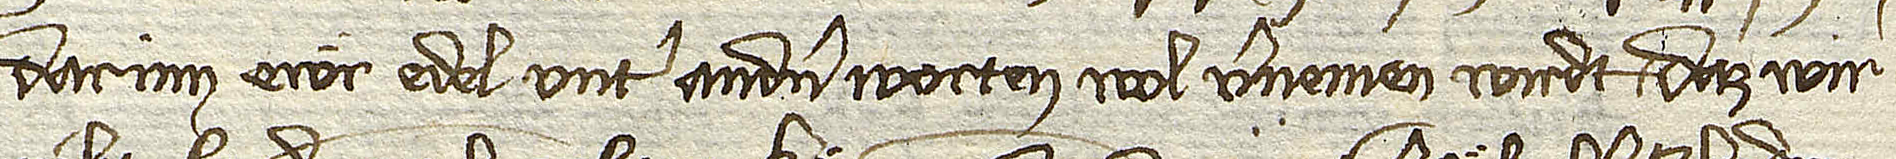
Darinn ewr edel vnt* and*n worten wol v*nemen wirdt / Daʒ wir
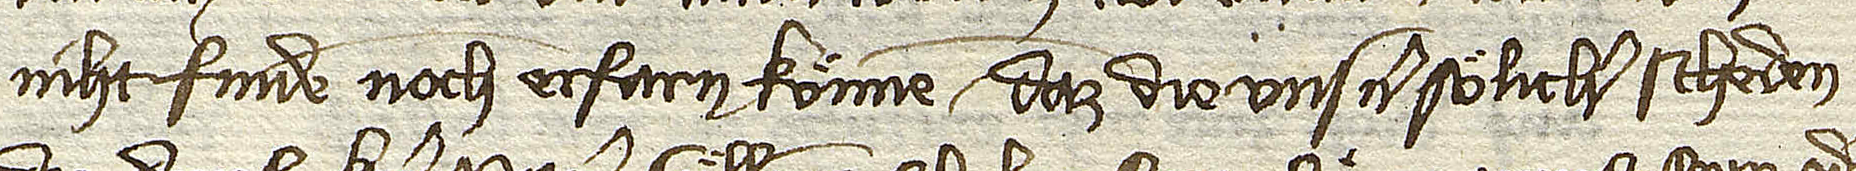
niht finde* noch erfarn könne* / daʒ die vnſ*n ſölich* ſcheden
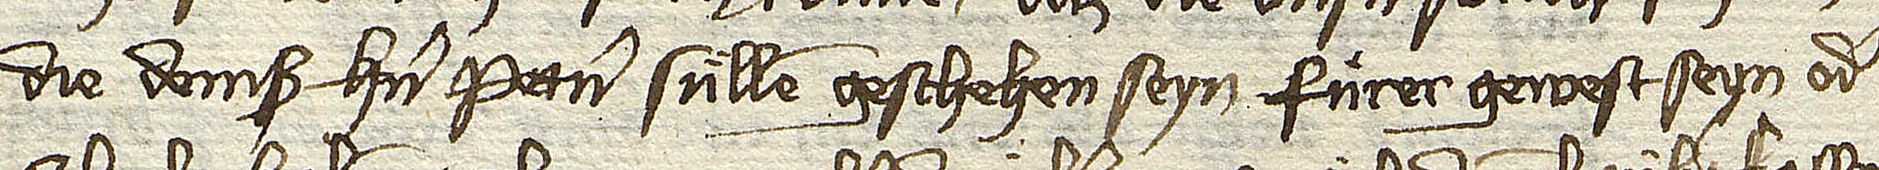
die demſ* h*n Pet*n ſülle* geſchehen ſeyn fürer geweſt ſeyn od*
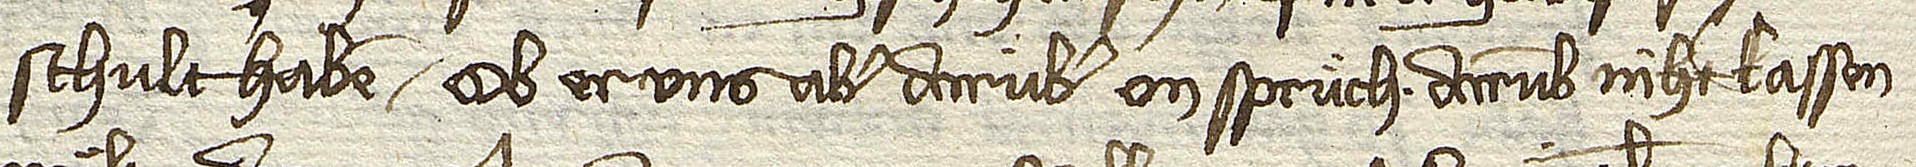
ſchult habe* / Ob er vns ab* darüb* on ſprüch . daru*b niht laſſen
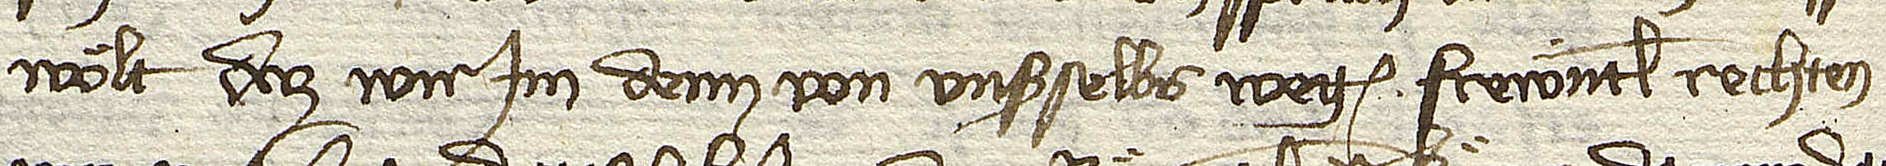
wölt daʒ wir Im denn von vnſ* ſelbs weg* . frewntl* rechten
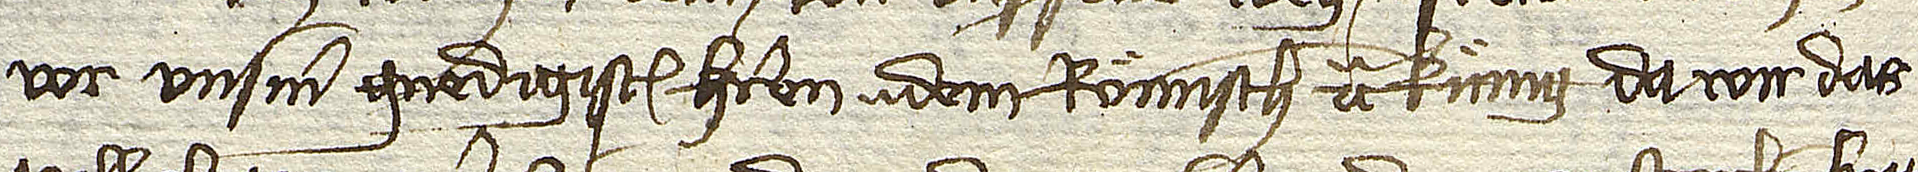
vor vnſ*m gnedigiſt* h*ren ~ dem Römiſch* ec* künig da wir das
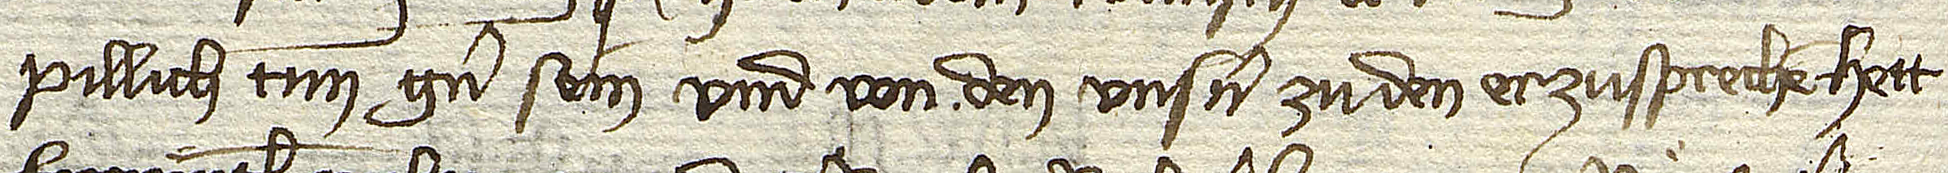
pillich tun g*n ſein vnd von den vnſ*n ʒu den er ʒuſpreche* hett
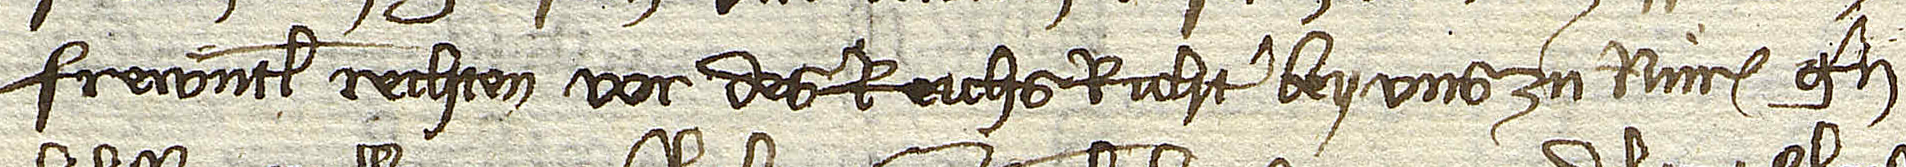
frewntl* rechten vor des Reichs Richt* bey vns ʒu Nür* g*n
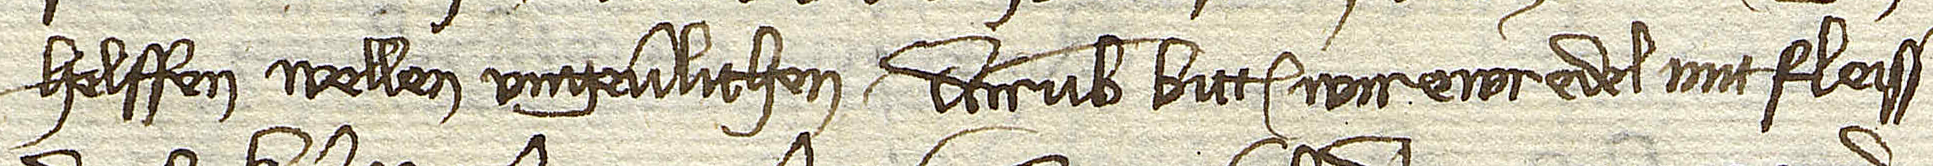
helffen wellen vngeu*lichen / Daru*b bitt* wir ewr edel mit fleiſſ
